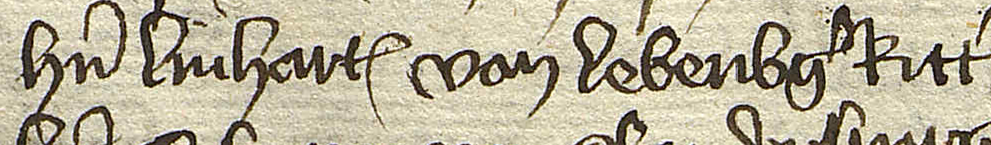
hn* linhart* von lebenbg* Ritt*
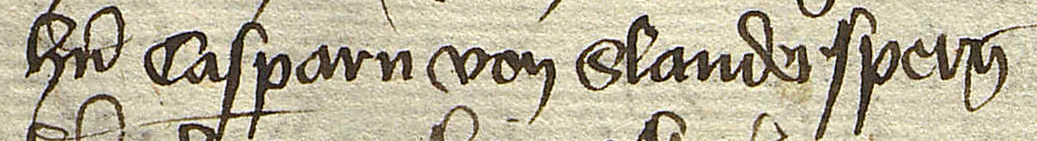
hn* Caſparn von Slanderſperg
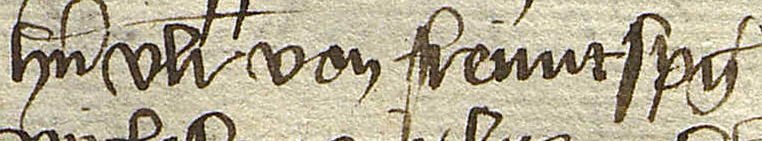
hn* vlr* von freuntſpg*
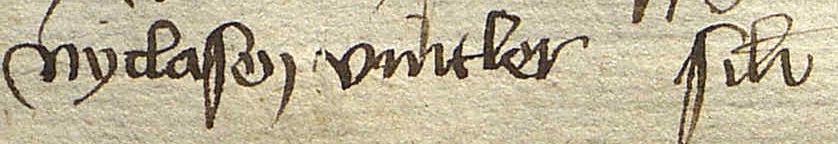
Nyclaſen vintler ſilr*
